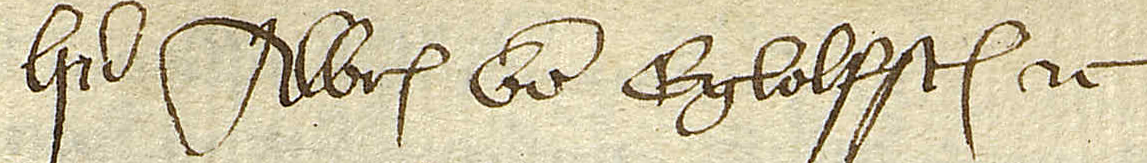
hn* Albr* vo* Eglofſt* ec*
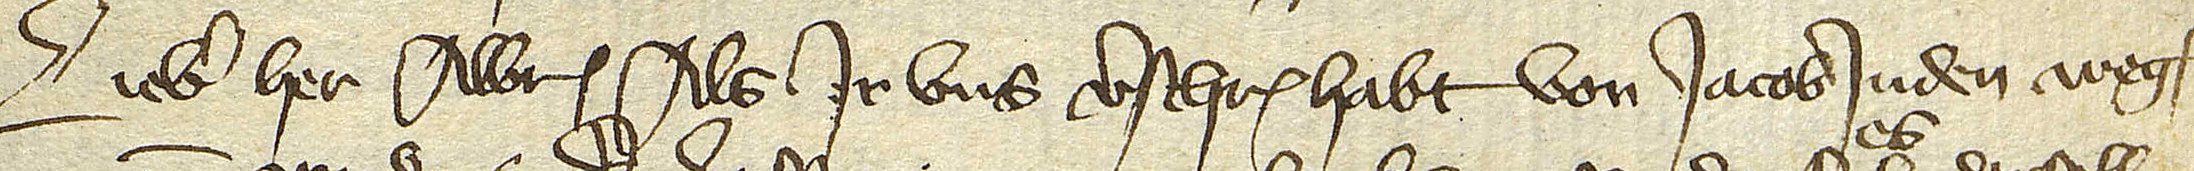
Lieb* her Albr* Als Ir vns v*ſchr* habt von Iacob Iuden weg*
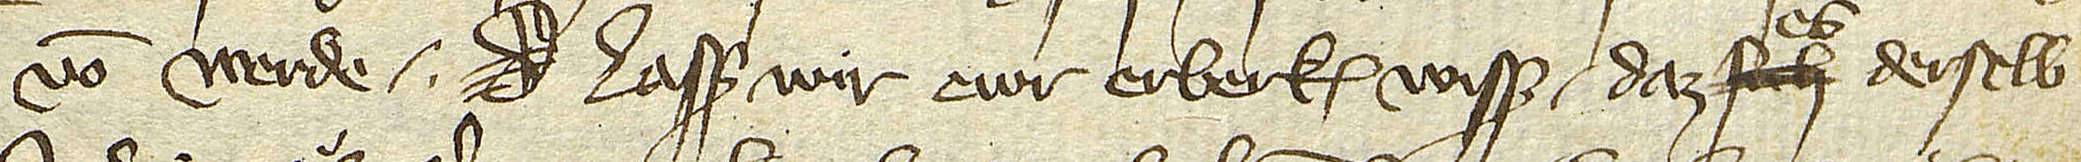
vo* werde / . D Laſſ* wir ewr erberk* wiſſ* / daʒ ſich derſelb
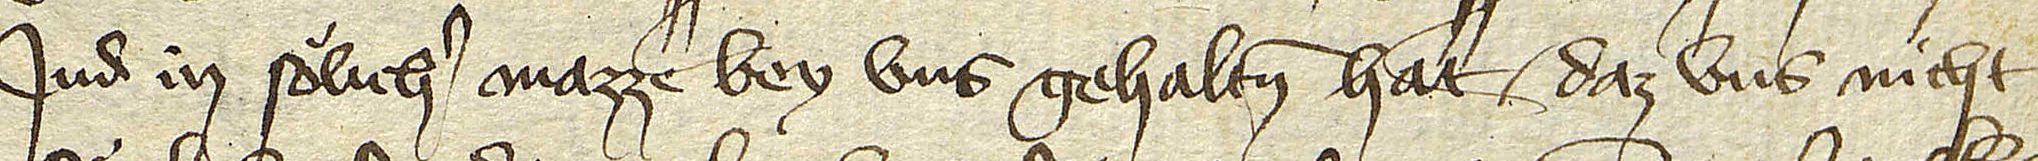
Iud in ſölich* maʒʒe bey vns gehaltn* hat / daʒ vns nicht
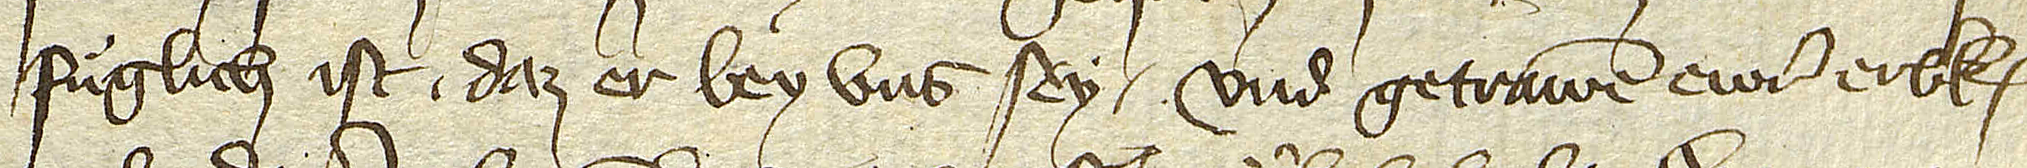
füglich iſt / daʒ er bey vns ſey / . vnd getrawe* ewr* erb*k*
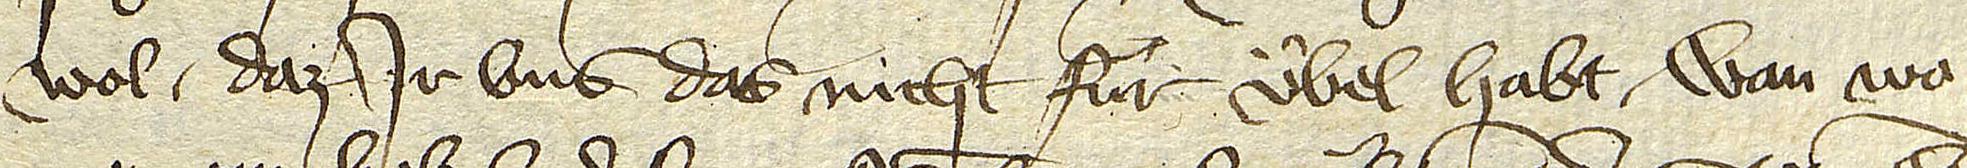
wol / daʒ Ir vns das nicht für v̈bel habt / wan wo
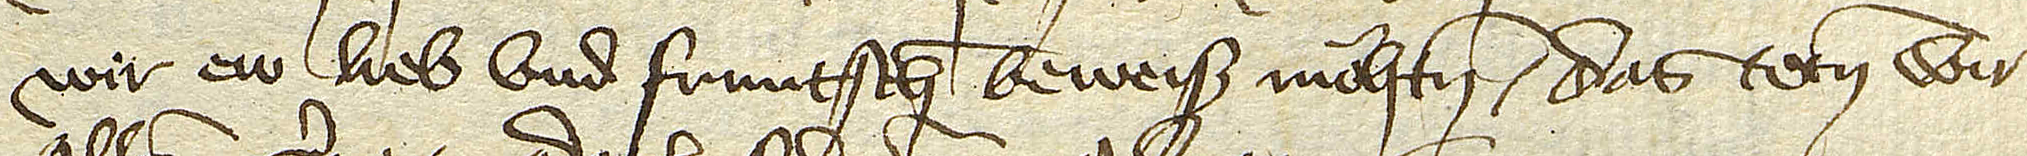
wir ew lieb vnd fruntſch* beweiſ* möhtn* / Das tetn* wir
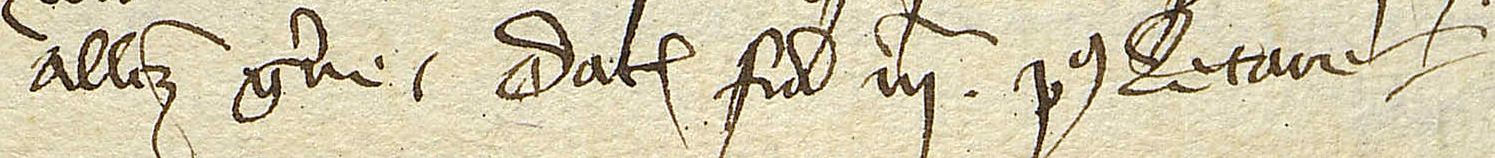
allcʒ* g*ne / Dat* fia* iii* . p* Letare /
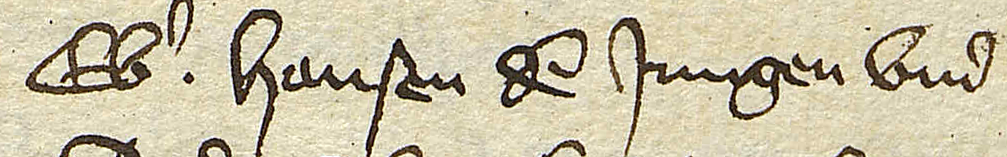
Eb* . hanſen de* Iungen vnd
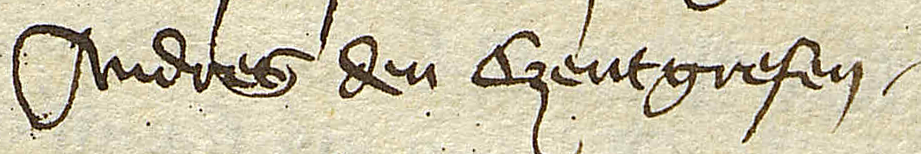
Andres den Cʒentgrefen /
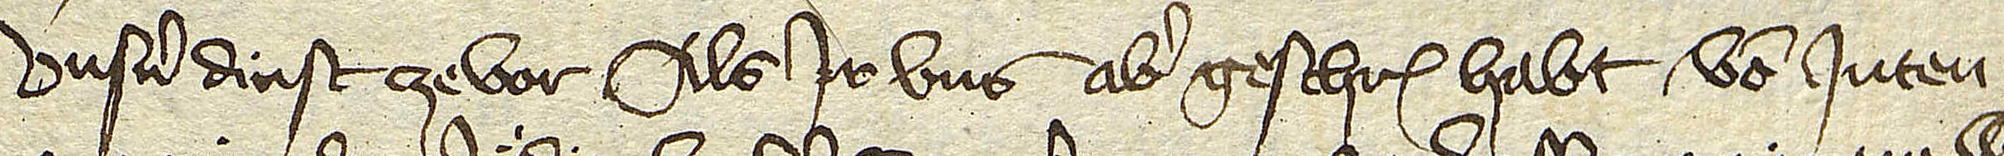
Vnſn* dinſt cʒevor / Als Ir vns ab* geſchr* habt / vo* Iuten
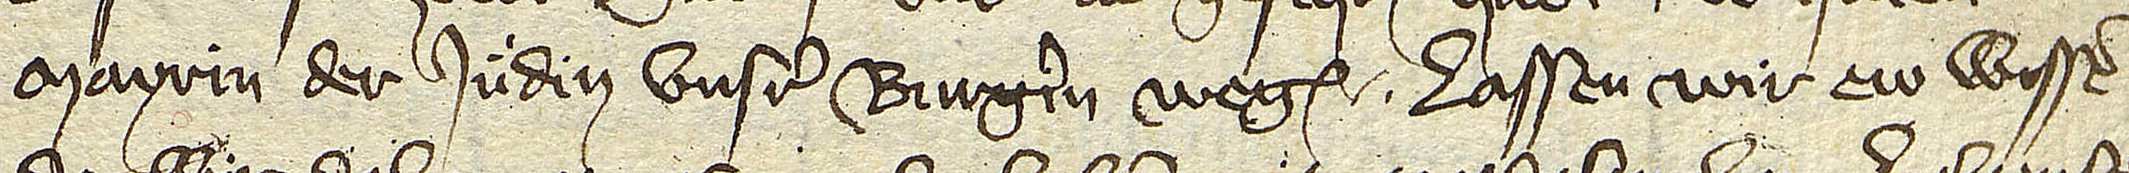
Mayrin der Iüdin vnſr* Burg*in weg* / . Laſſen wir ew wiſſe*
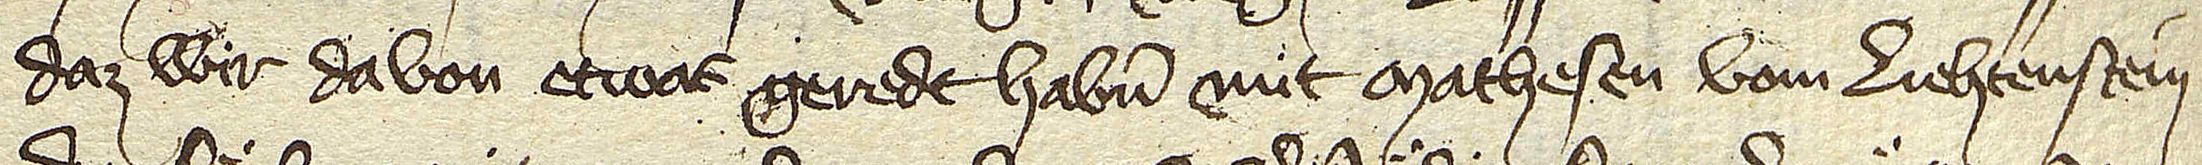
daʒ wir davon etwas geredt habn* mit Matheſen vom Liehtenſtein
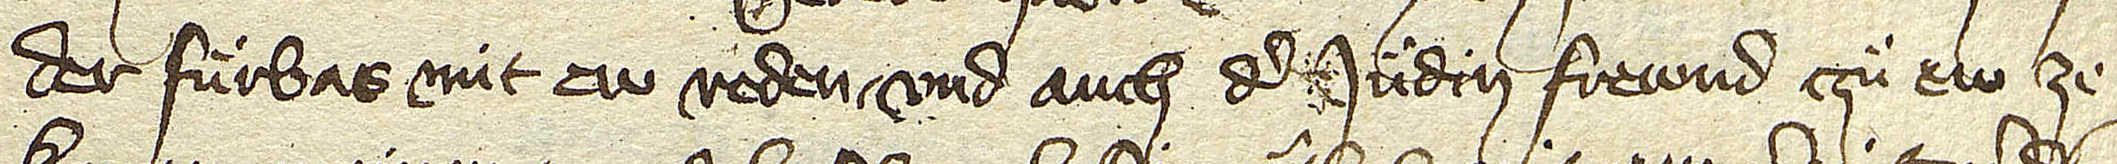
der fürbas mit ew reden / vnd auch d* Iüdin frewnd cʒü ew cʒe
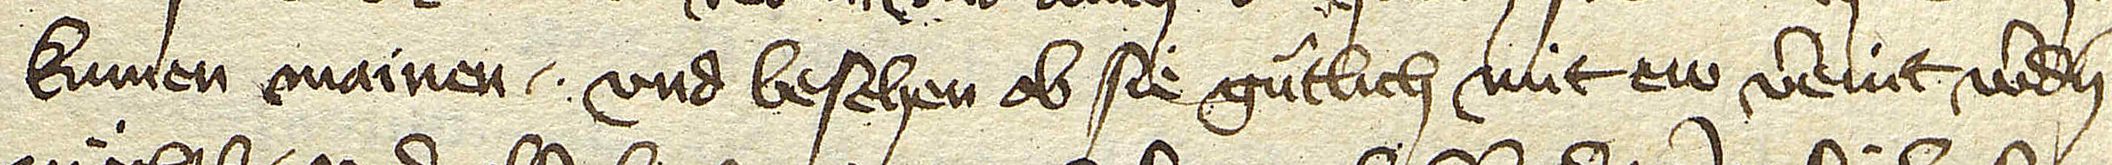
kumen mainen / . vnd beſehen ob ſie gütlich mit ew v*eint w*dn*
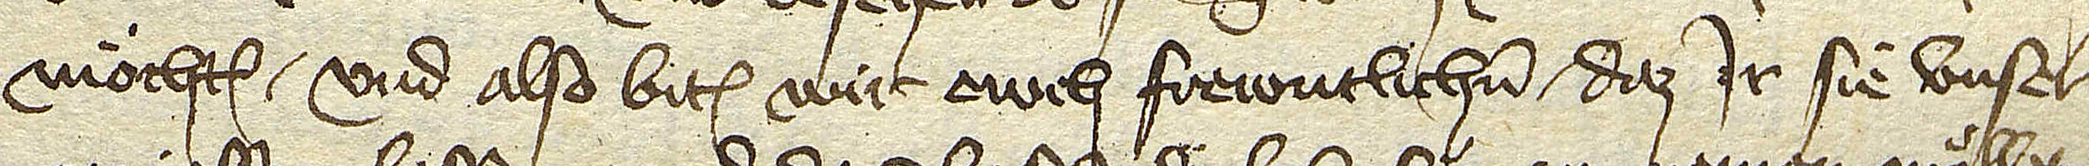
möcht* / vnd alſo bit* wir ewch frewntlichn* / daʒ Ir ſie vnſer
